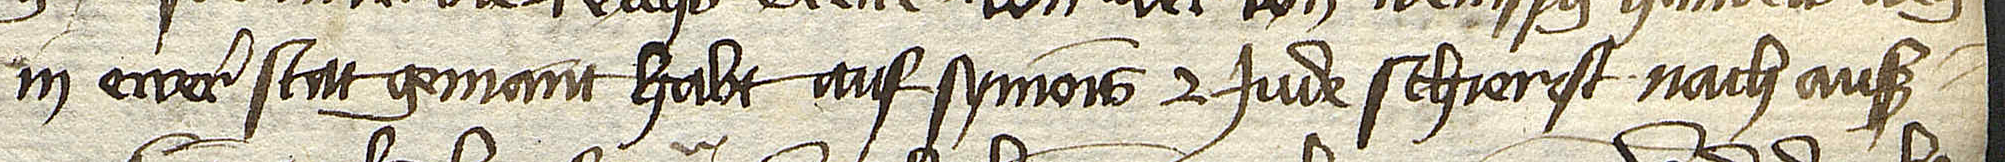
in ewer* ſtat gemant habt auf ſymo*is @ Iude ſchieriſt nach auſʒ =
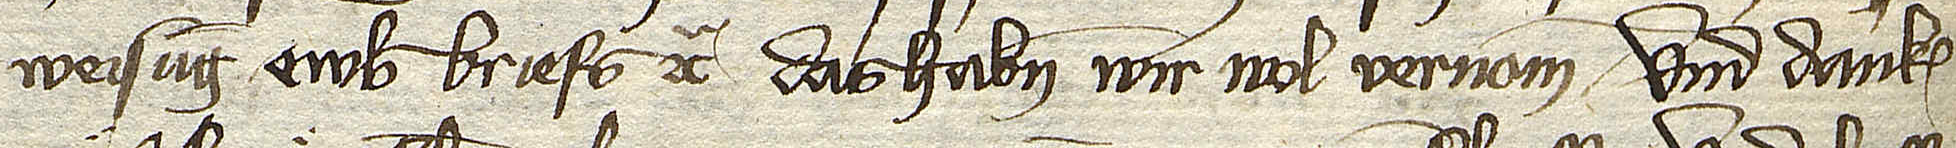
weiſu*g / ew*s briefs ec* das habn* wir wol vernom* / Vnd dank*
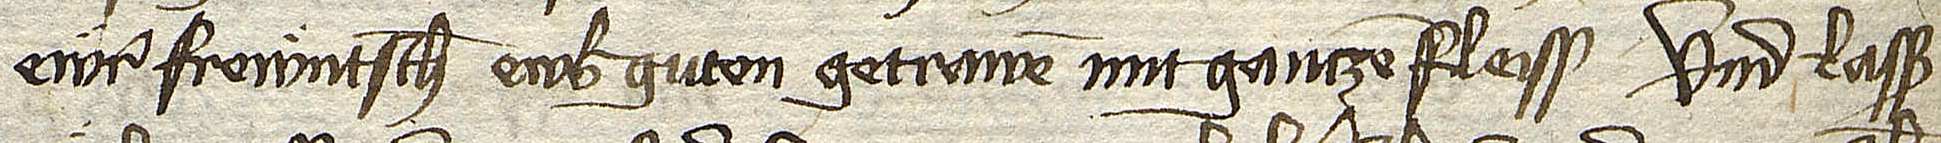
eẅr* freẅntſch* ew*s guten getrawe* mit gancʒe* fleiſſ / Vnd laſſ*
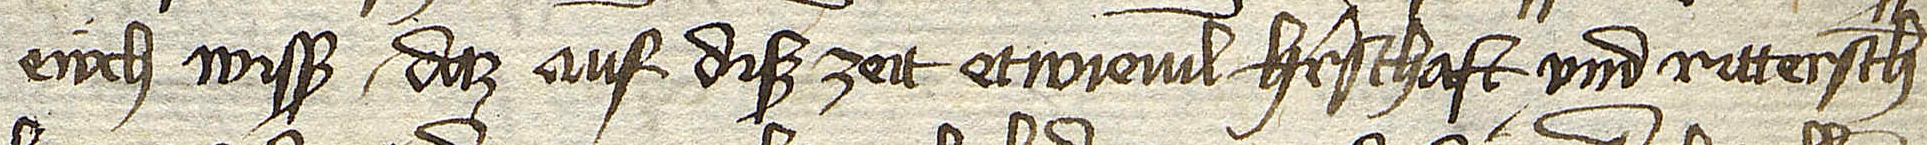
eẅch wiſſ* / daʒ auf diſʒ ʒeit etwieuil hr*ſchaft vnd ritterſch*
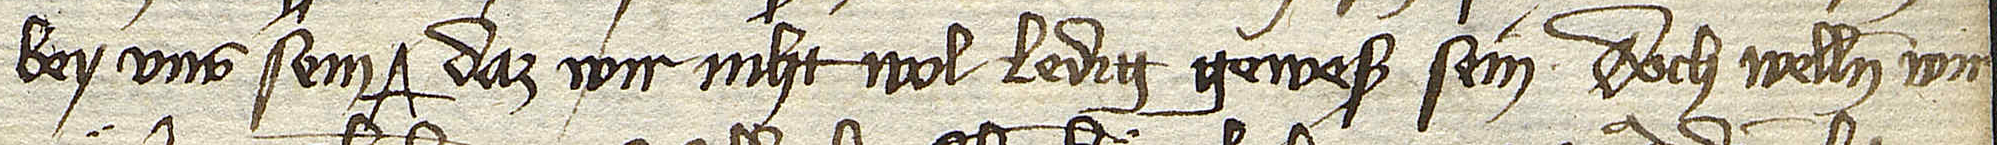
bey vns ſein daʒ wir niht wol ledig geweſ* ſein . Doch welln* wir
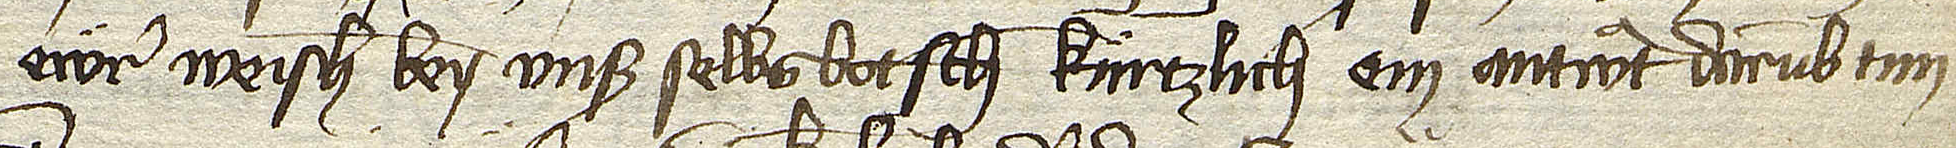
eẅr* weiſh* bey vnſ* ſelbs botſch* kürcʒlich ein antw*t darub* tun
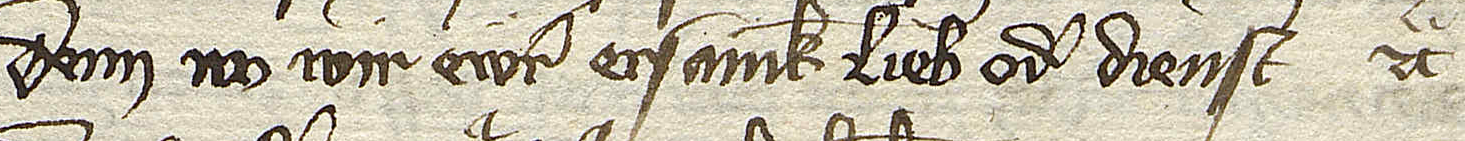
Denn wo wir eẅr* erſamk* lieb od* dienſt ec*
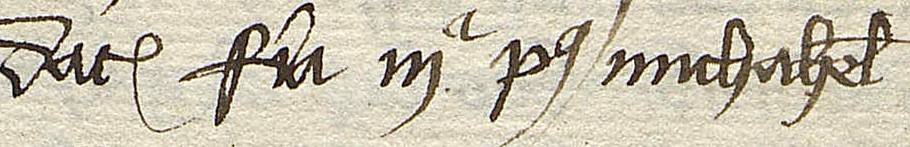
Dat* fi*a iii* p* michahel*
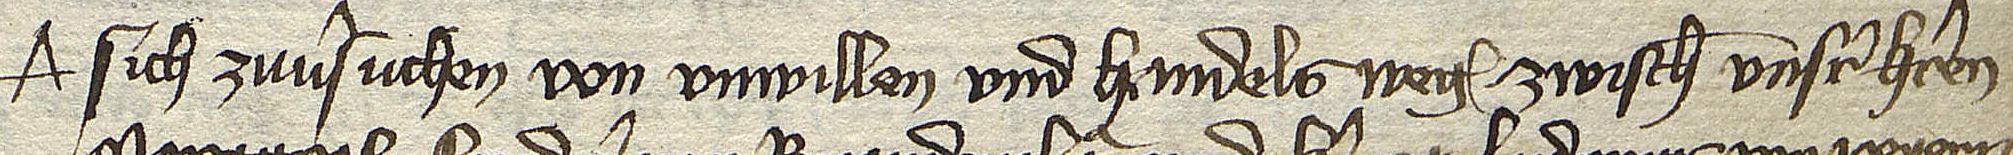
ſich ʒuu*ſuchen von vnwillen vnd handels weg* ʒwiſch* vnſr* h*ren
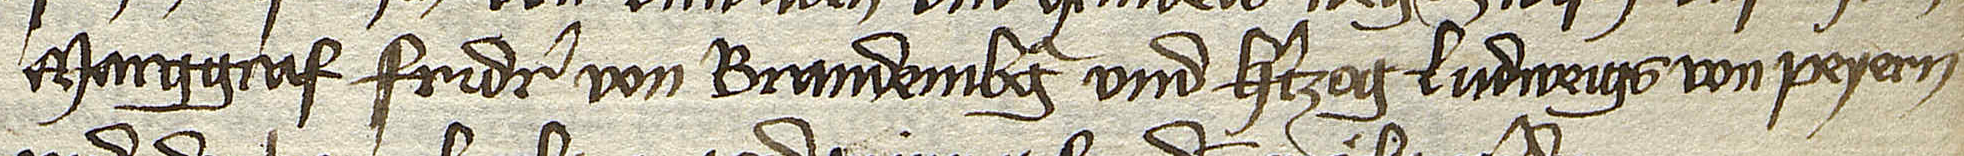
Marggraf fridr* von Brandemb*g vnd h*tʒog ludweigs von peyern
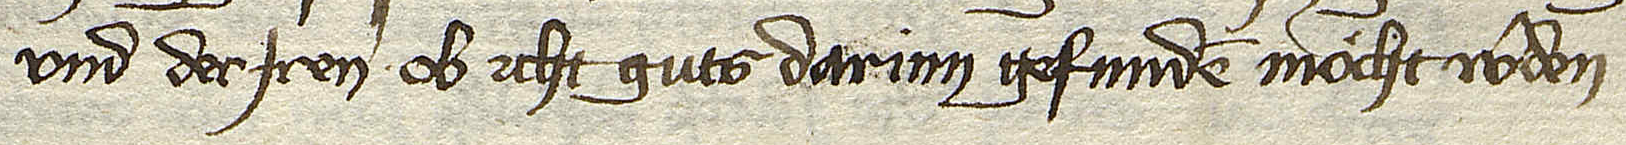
vnd der Iren ob icht guts darinn gefunde* möcht w*den
